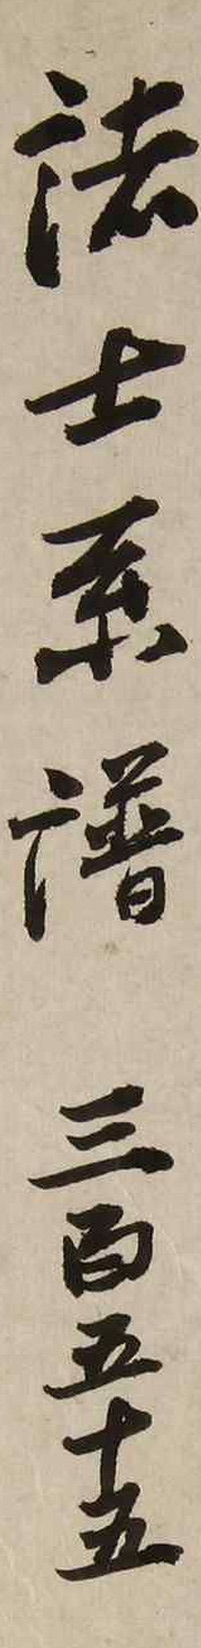諸士系譜三百五十五

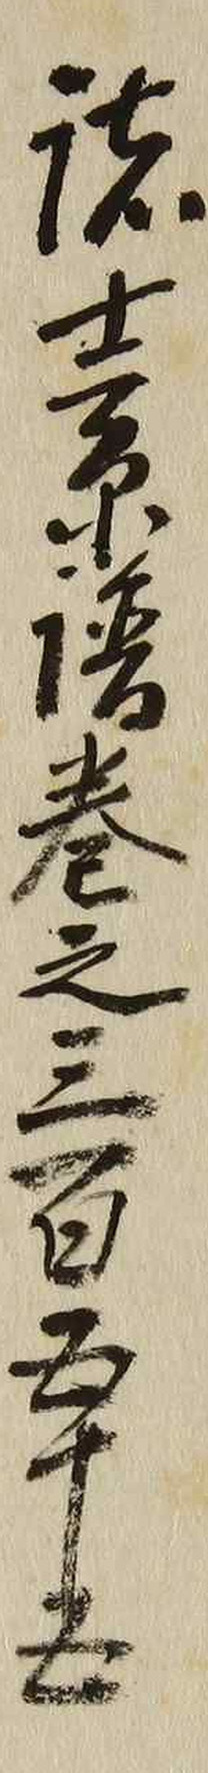諸士系譜巻之三百五十五
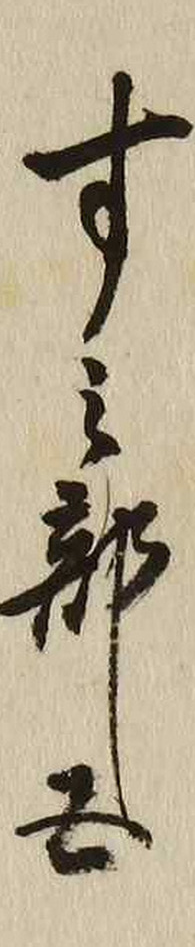す之部五
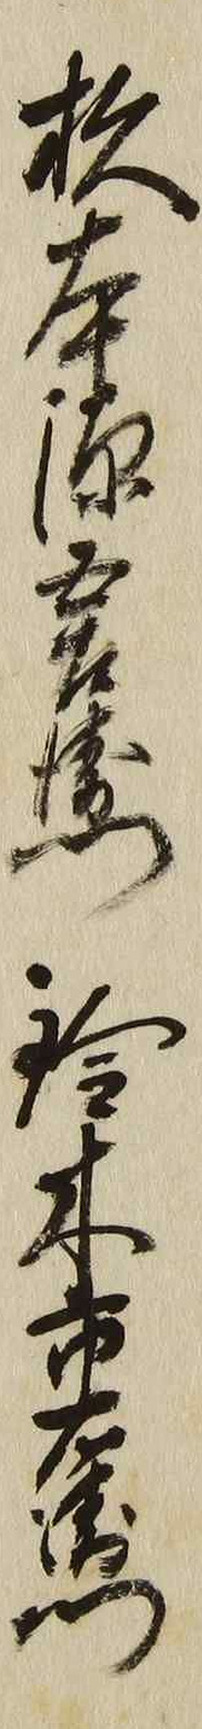杉本源五左衛門鈴木市右衛門

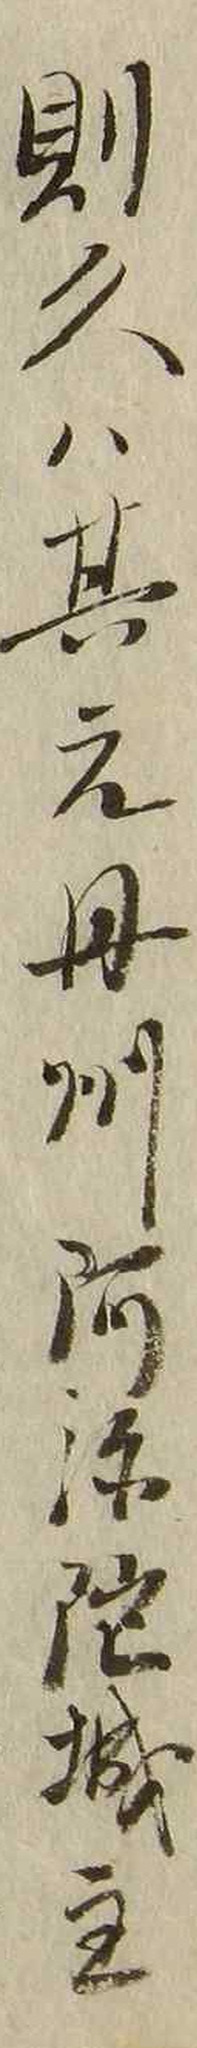則久ハ其元丹州阿弥陀城主
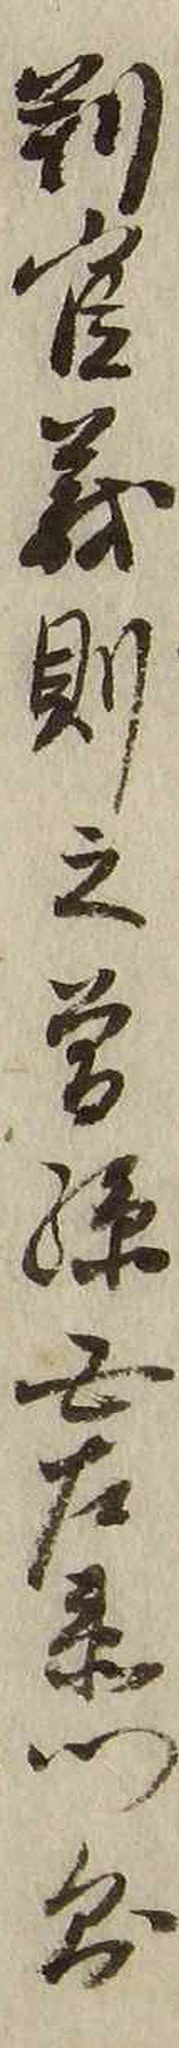判官義則之曽孫五左衛門則
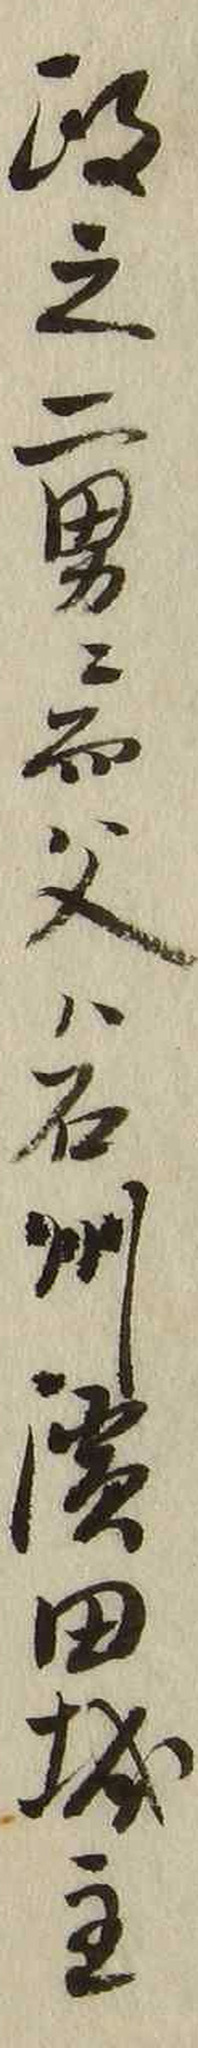政之二男ニ而父ハ石州浜田城主
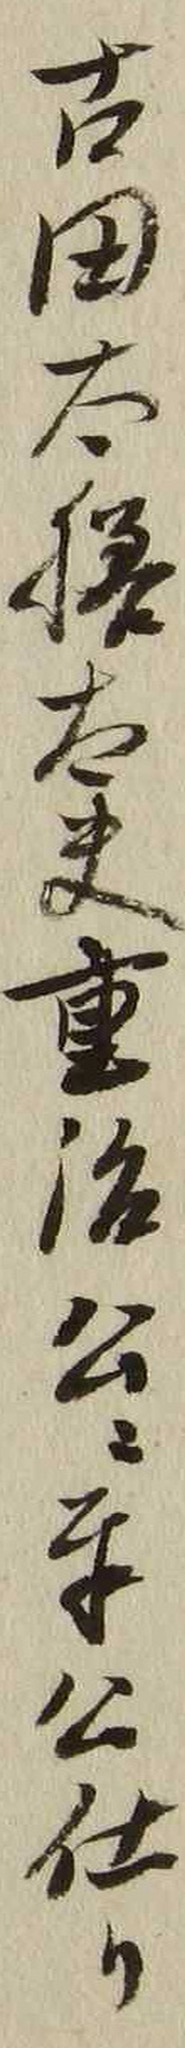古田太膳太夫重治公ニ奉公仕り
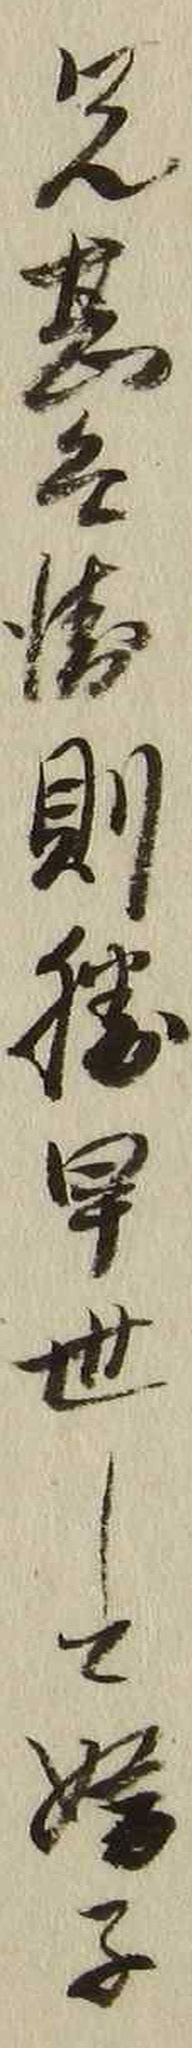兄甚兵衛則勝早世して嫡子
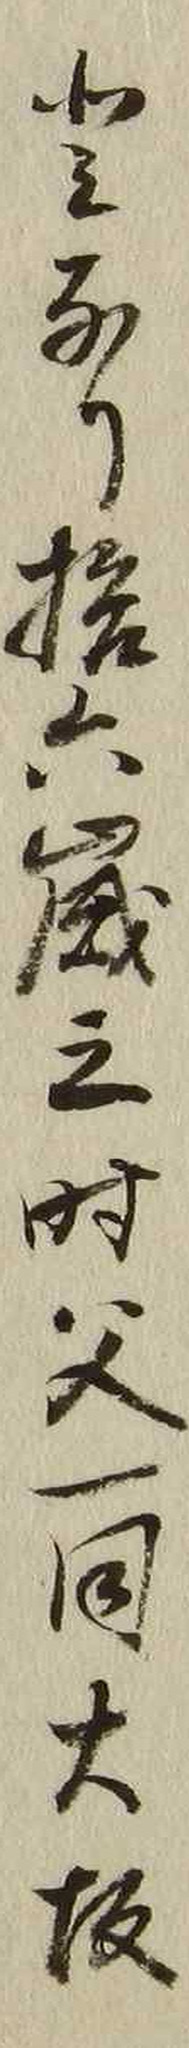となり拾六歳之時父一同大坂
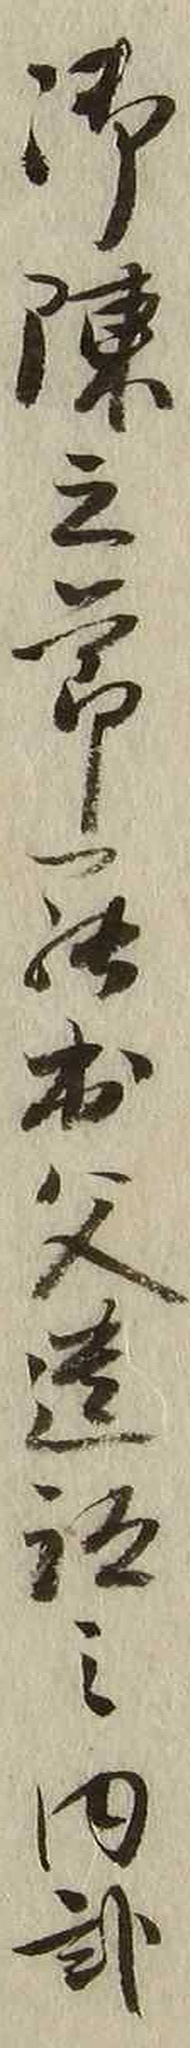御陣之節罷出父遺跡之内弐
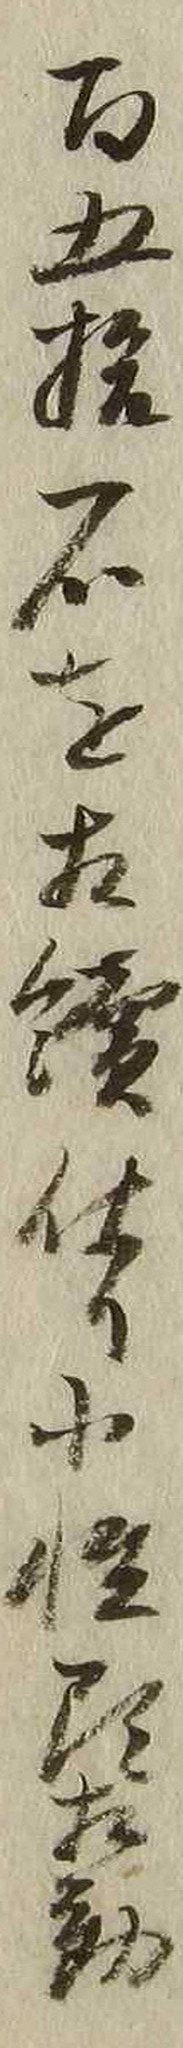百五拾石を相続仕り小性頭相勤
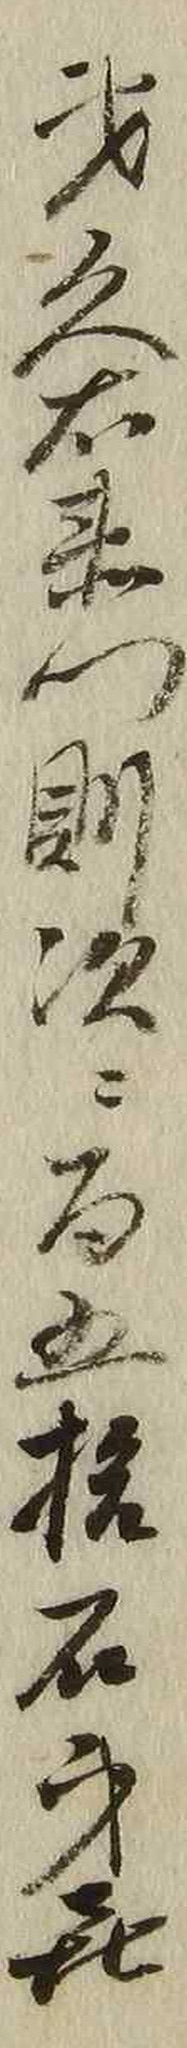弟久右衛門則次ニ百五拾石弟喜
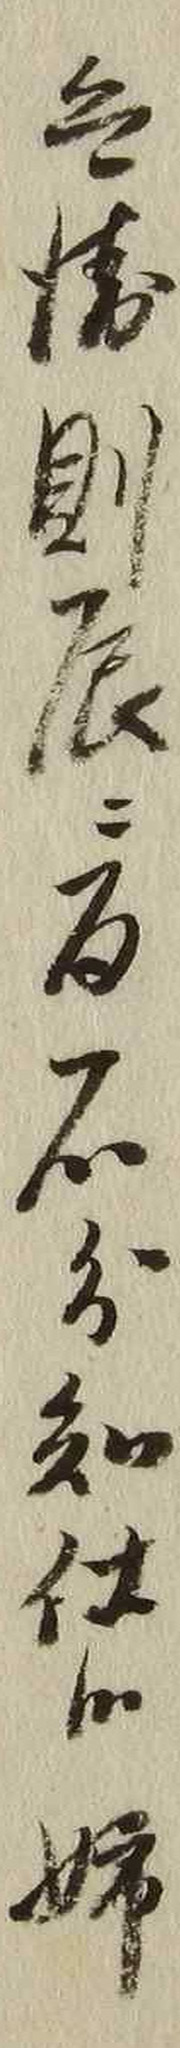兵衛則辰ニ百石分知仕候姉
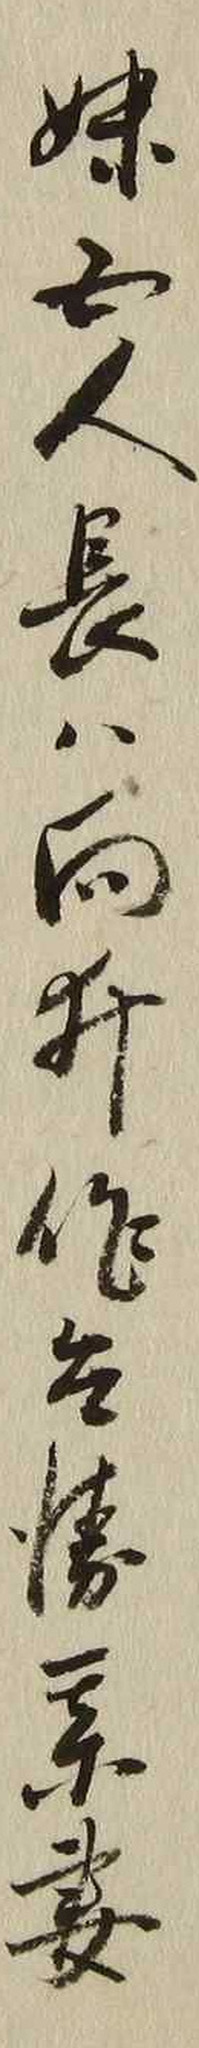妹五人長ハ向井作兵衛某妻
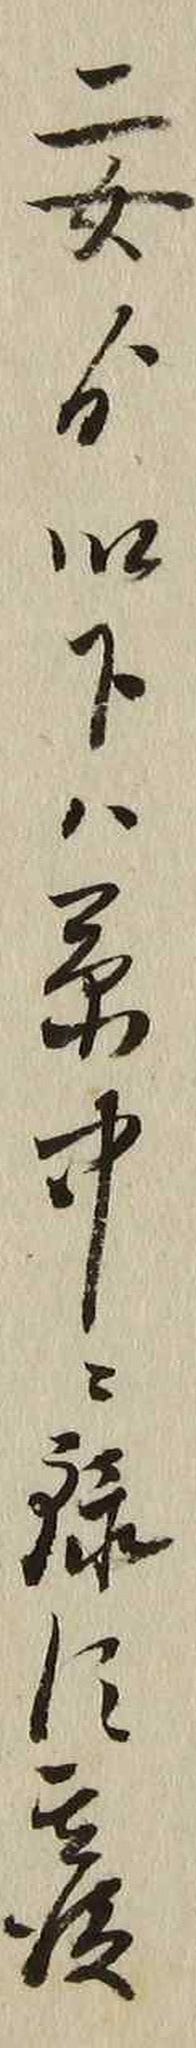二女ゟ以下ハ系中ニ録す其後
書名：諸士系譜　巻之355　す之部5
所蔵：会津若松市立会津図書館
